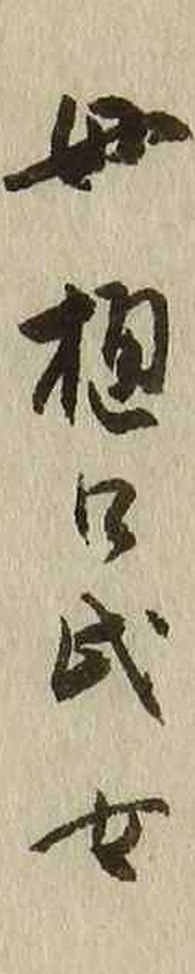母樋口氏女
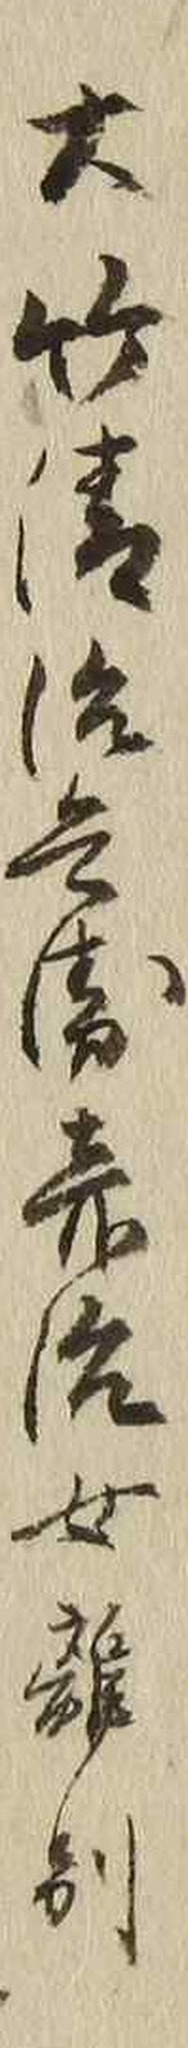大竹清治兵衛喜治女離別
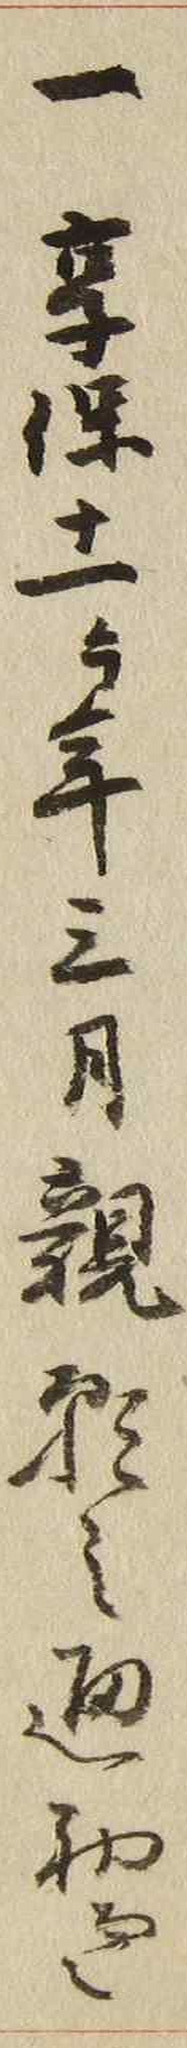一享保十一午年三月親願之通初而之
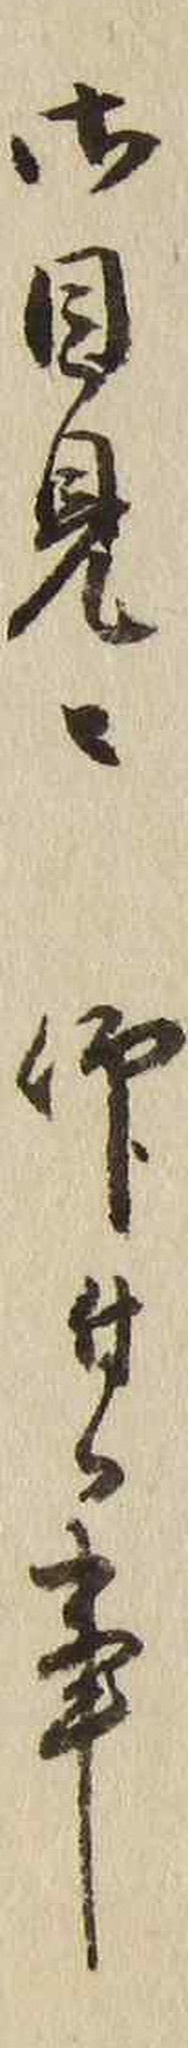御目見被仰付候事
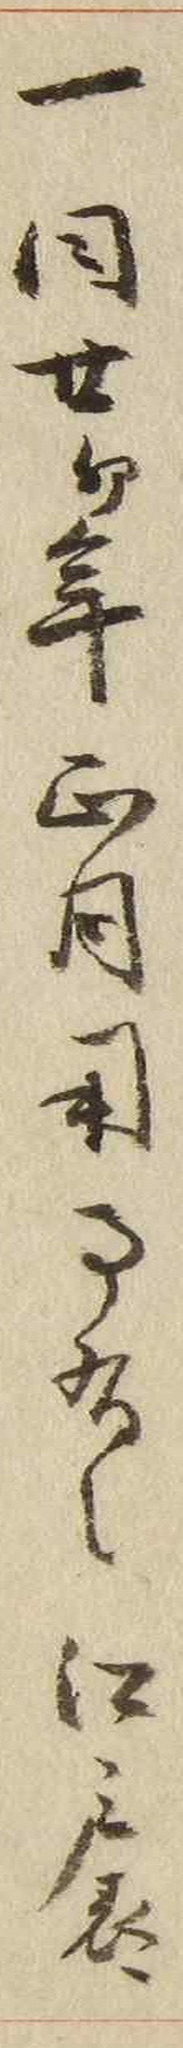一同廿卯年正月用事有之江戸表へ

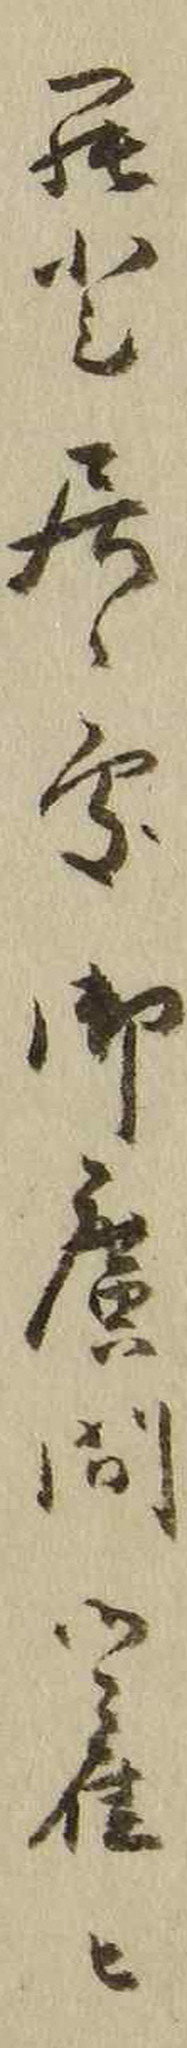罷登居候処御広間御雇被
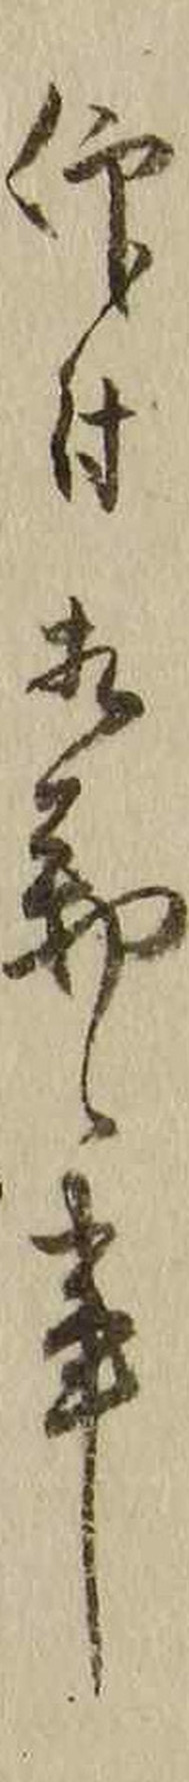仰付相勤候事
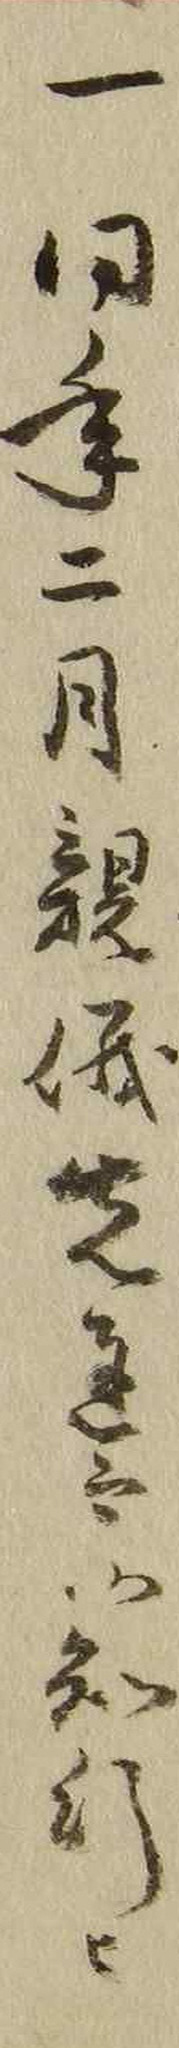一同年二月親儀先達而御知行被
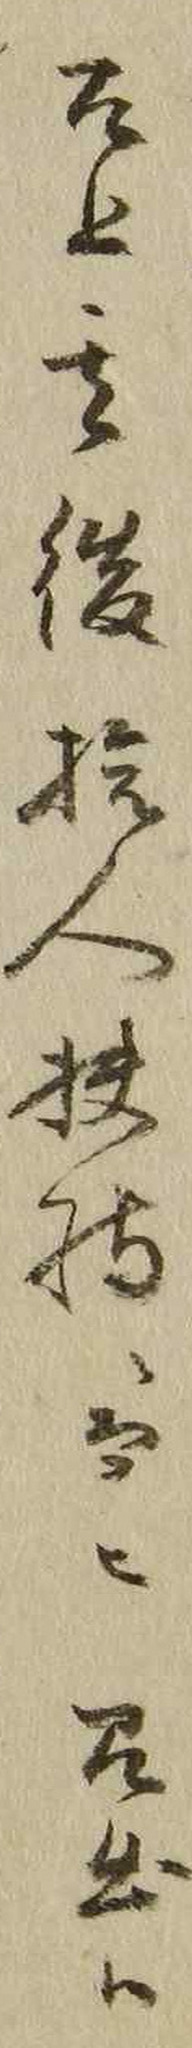召上其後拾人扶持ニ而被召出候
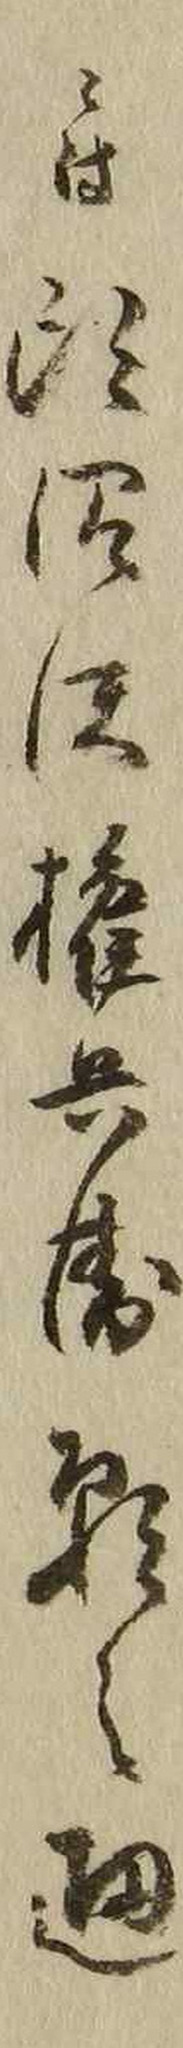ニ付頭沼沢権兵衛願之通
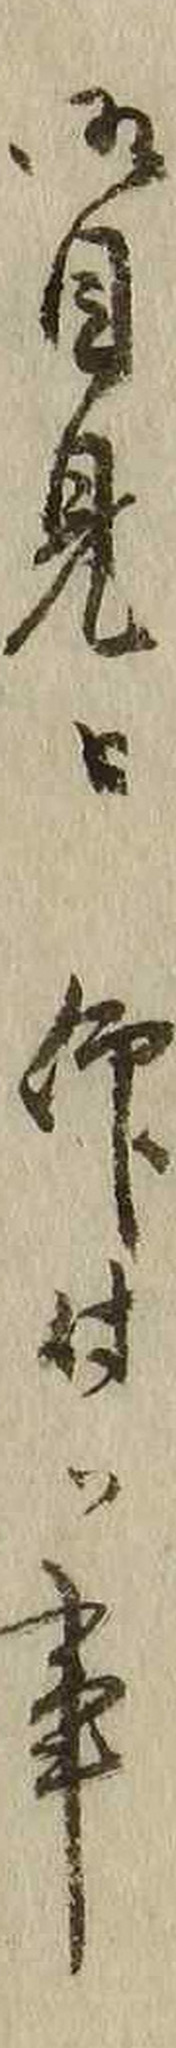御目見被仰付候事
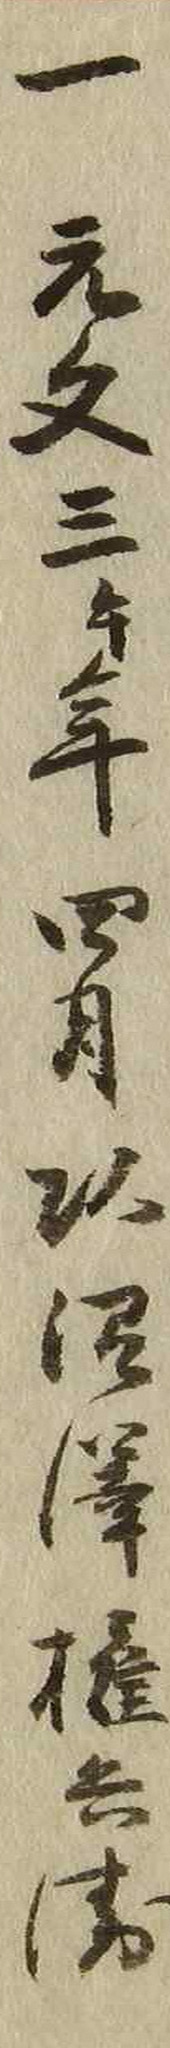一元文三午年四月頭沼沢権兵衛
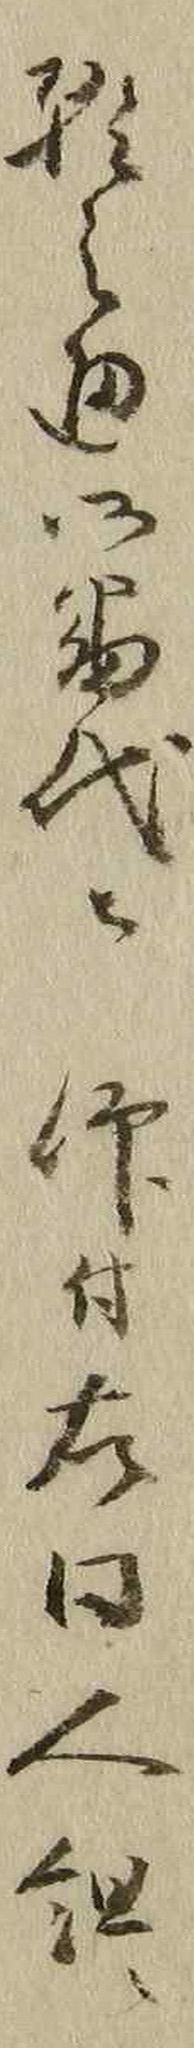願之通御番代被仰付右同人組ニ
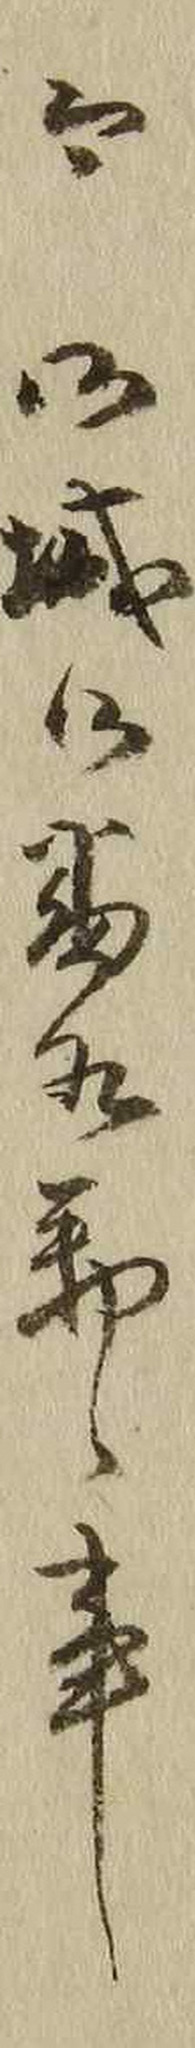而御城御番相勤候事
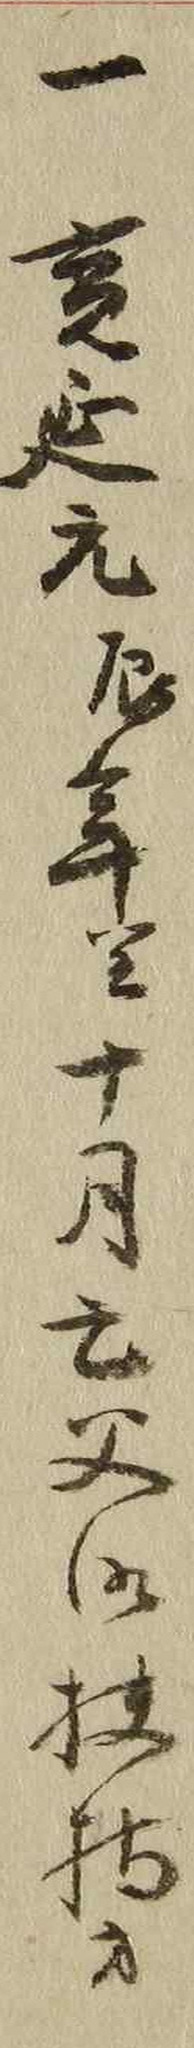一寛延元辰年閏十月亡父御扶持方
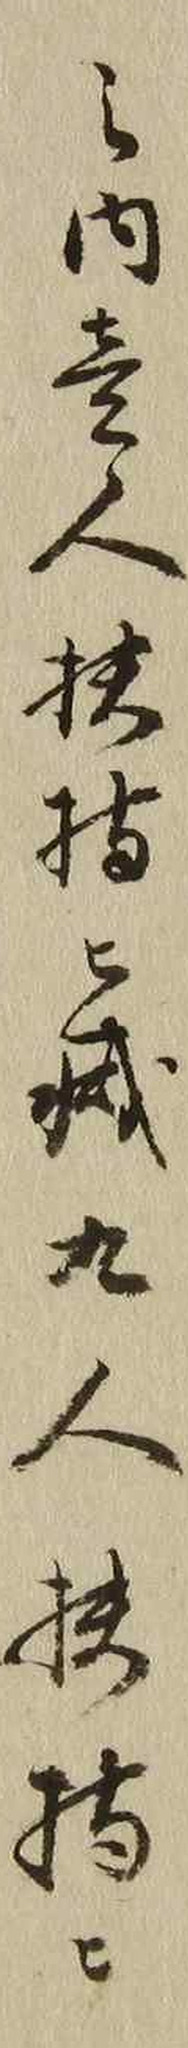之内壱人扶持被減九人扶持被
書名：諸士系譜　巻之232　け之部1
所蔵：会津若松市立会津図書館
